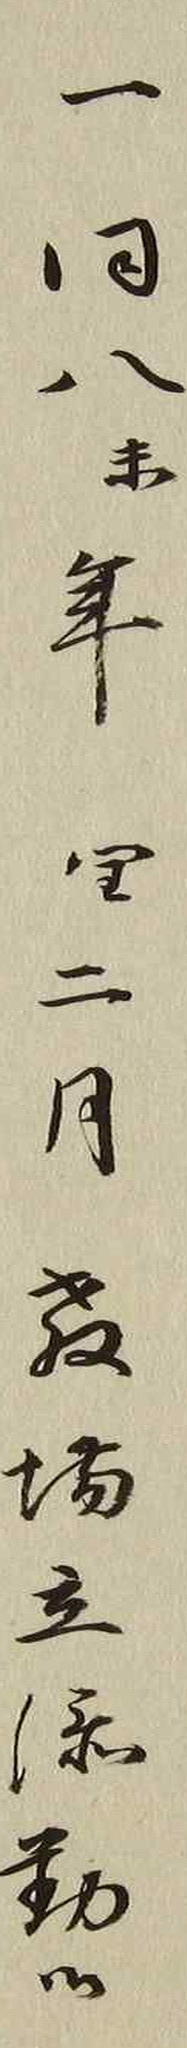一同八未年閏二月教場立ち添え勤御
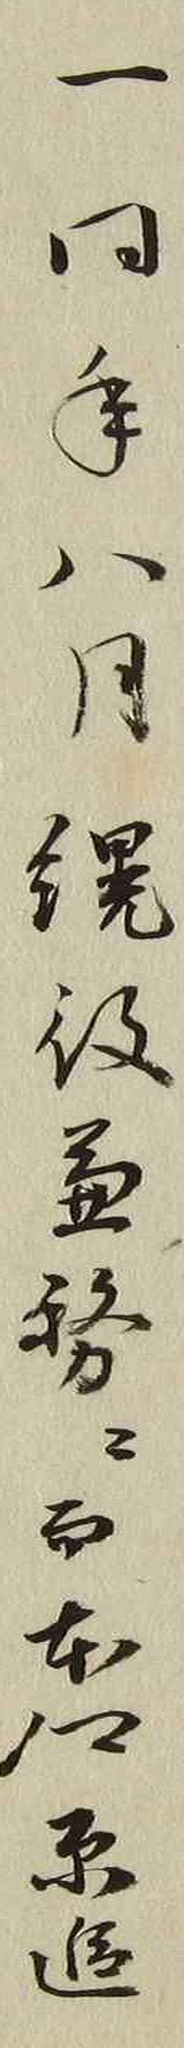一同年八月幌役兼務二て本郷原追
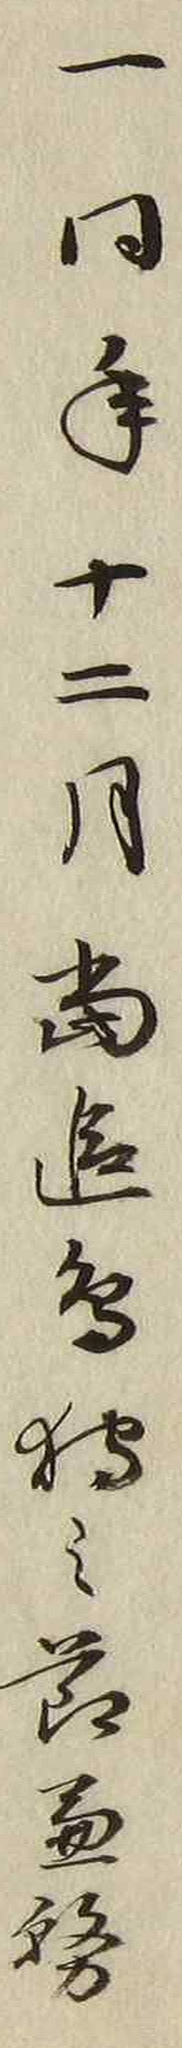一同年十二月当追鳥狩之節兼務

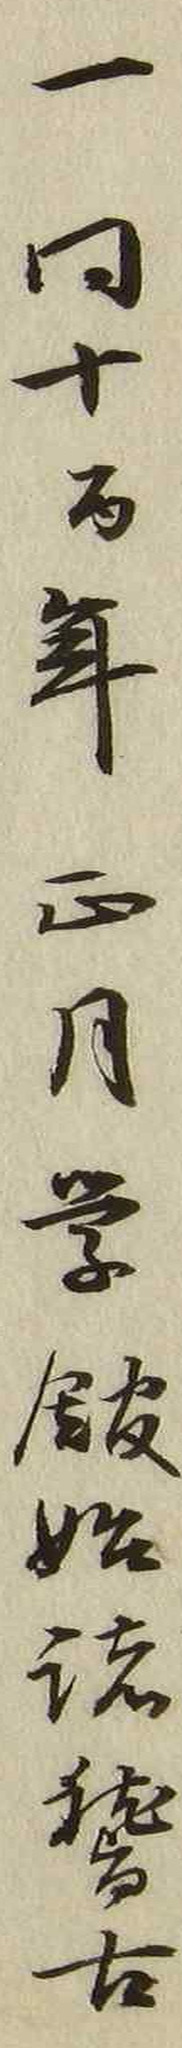一同十酉年正月学館始め諸稽古
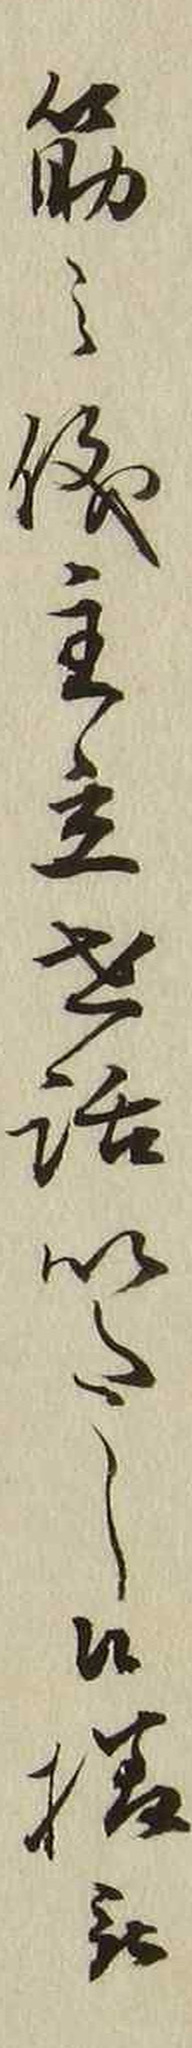筋之儀主立世話いたし候様
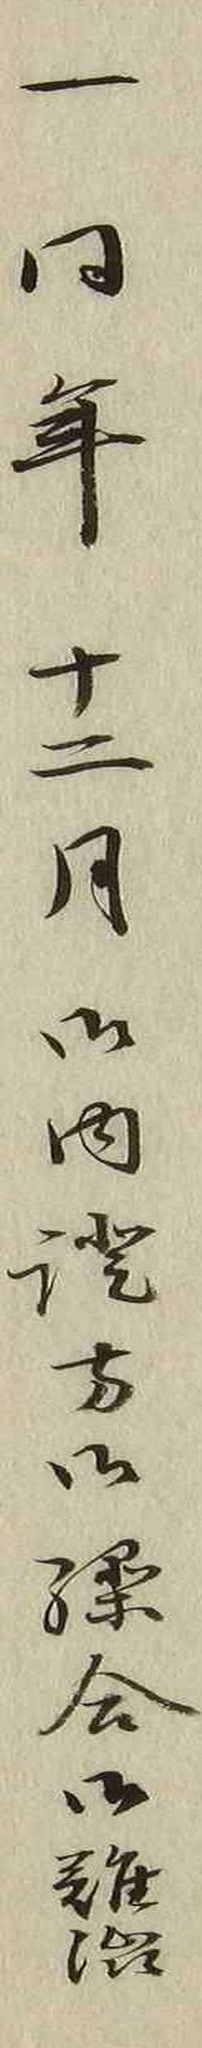一同年十二月御内証方御繰り合い御難渋
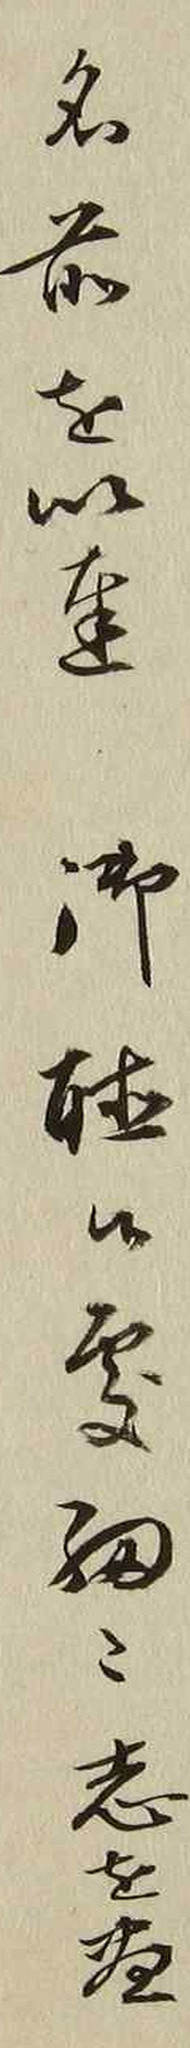名前を以て御聴候処細々志を尽くし
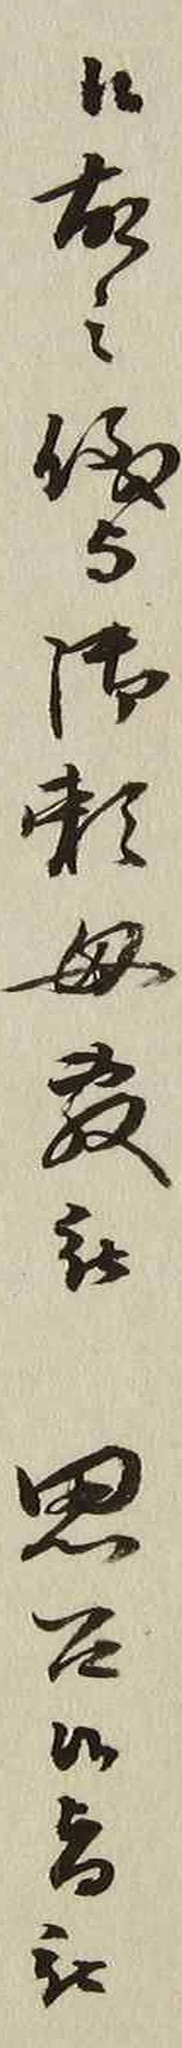候故之儀と御頼母敷思召され候旨
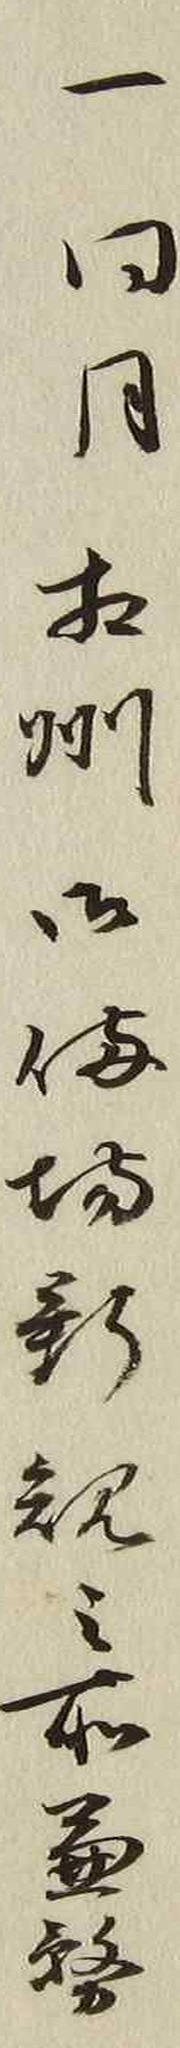一同月相州御備場新規之処兼務
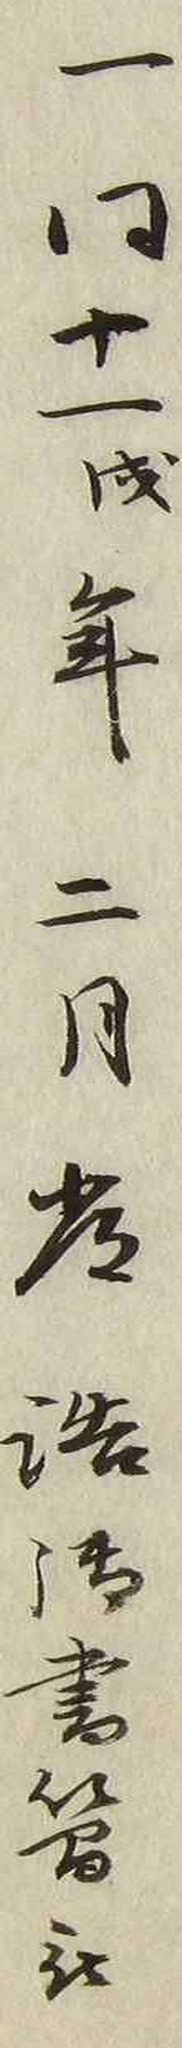一同十一戌年二月常詰御書簡

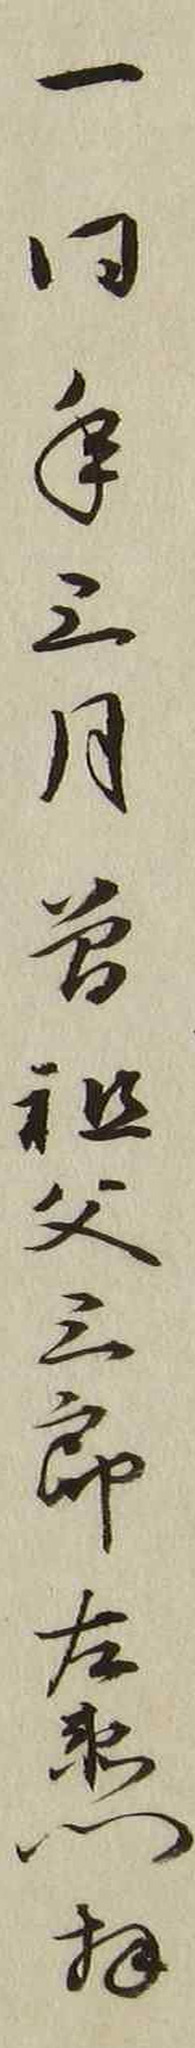一同年三月曾祖父三郎左衛門拝
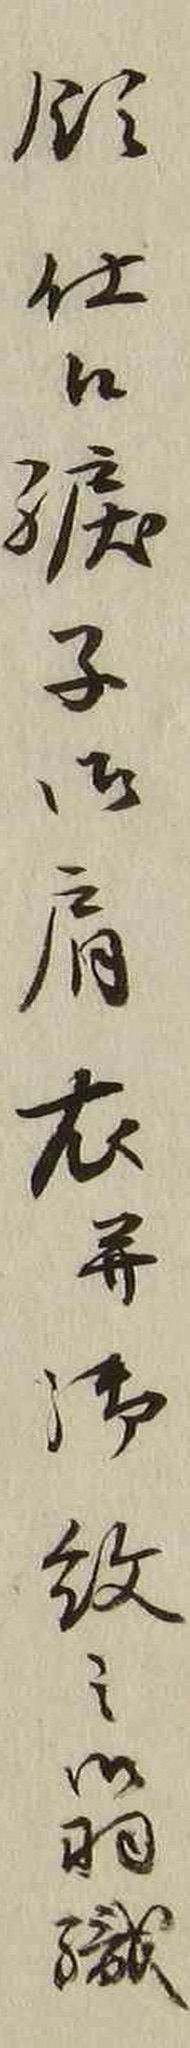領仕り候扇子御肩衣幷御紋之御羽織
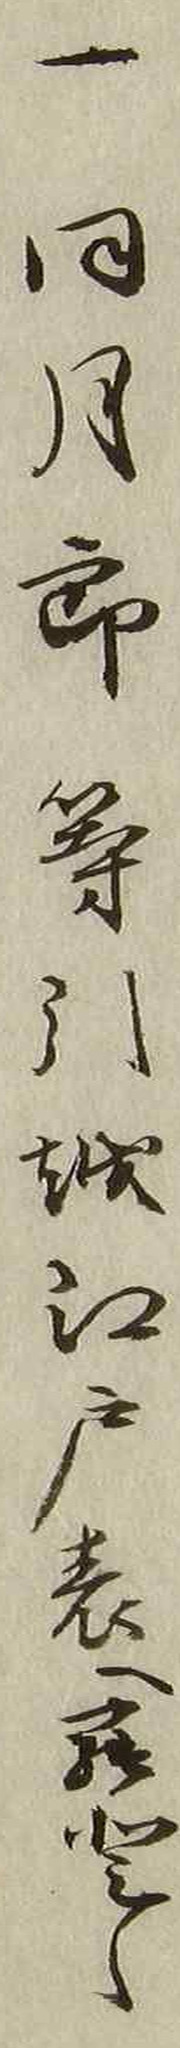一同月郎等江戸表へ罷り登り候
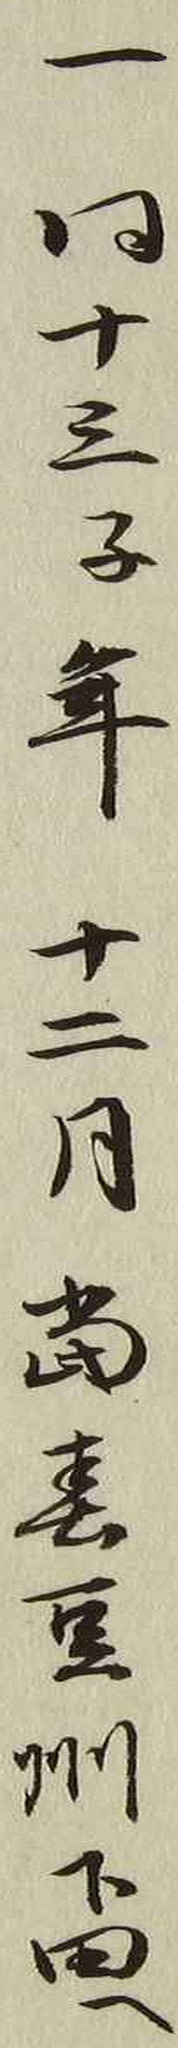一同十三子年十二月当豆州下田へ
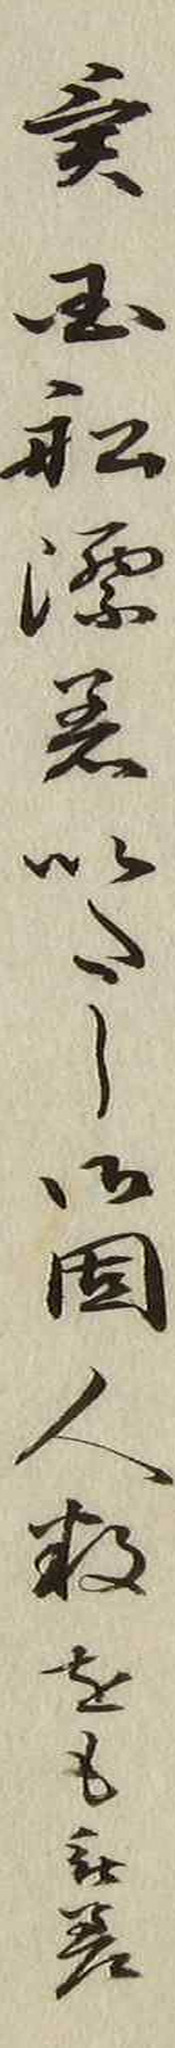異国船漂着いたし御固め人数をも差し
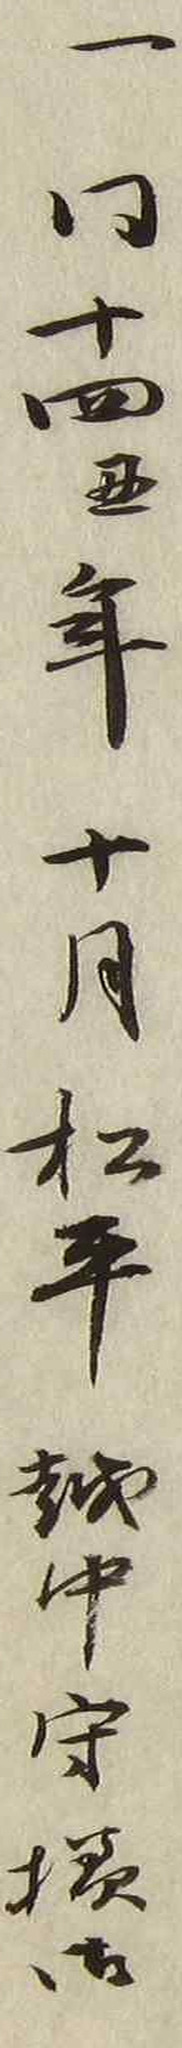一同十四丑年十月松平越中守様御
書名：諸士系譜　巻之16　い之部16
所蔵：会津若松市立会津図書館
